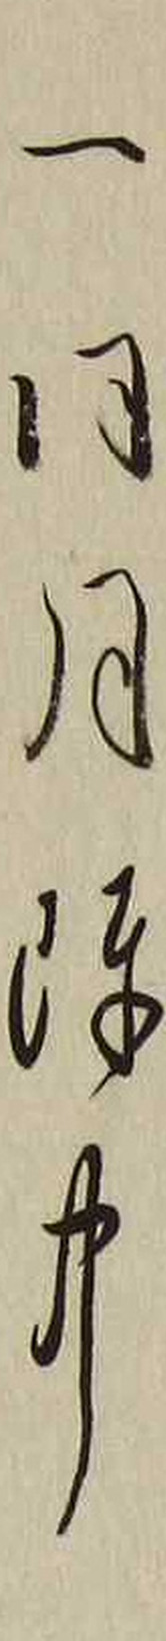一同月陣中
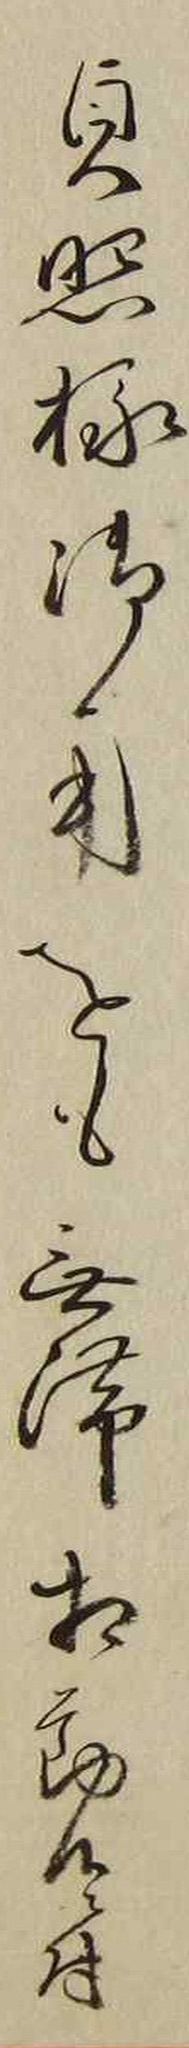貞照様御用をも無滞相勤候に付

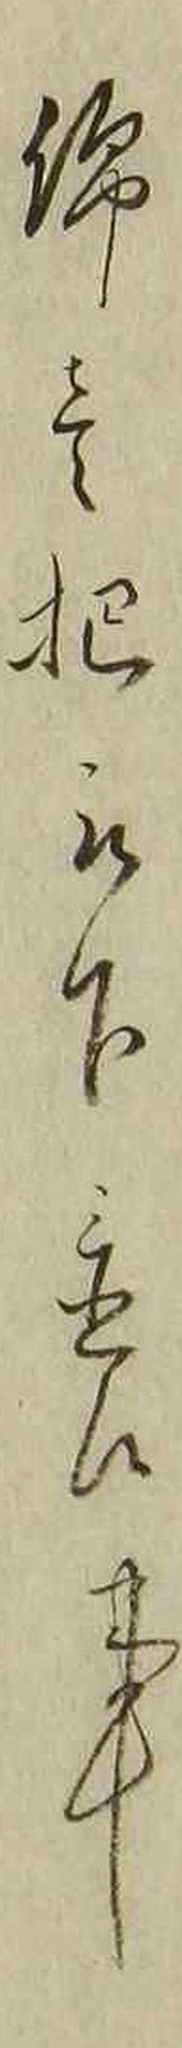綿壱把被下置候事
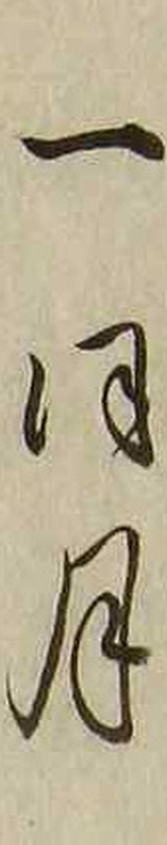一同月
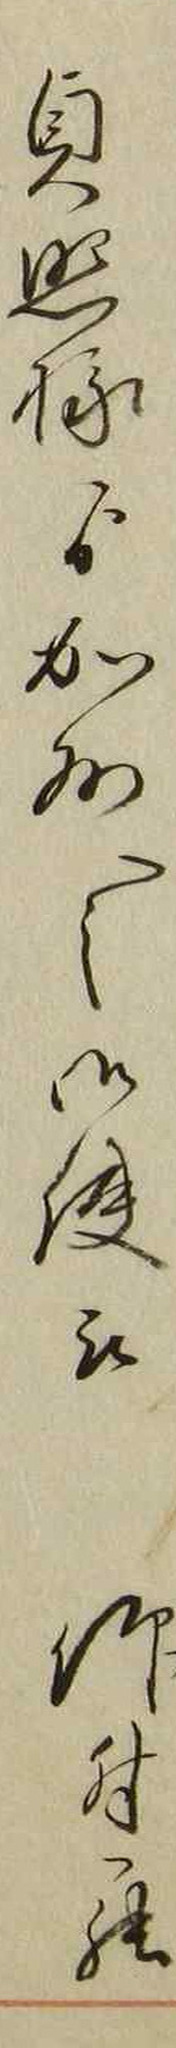貞照様より加州へ之御使被仰付罷
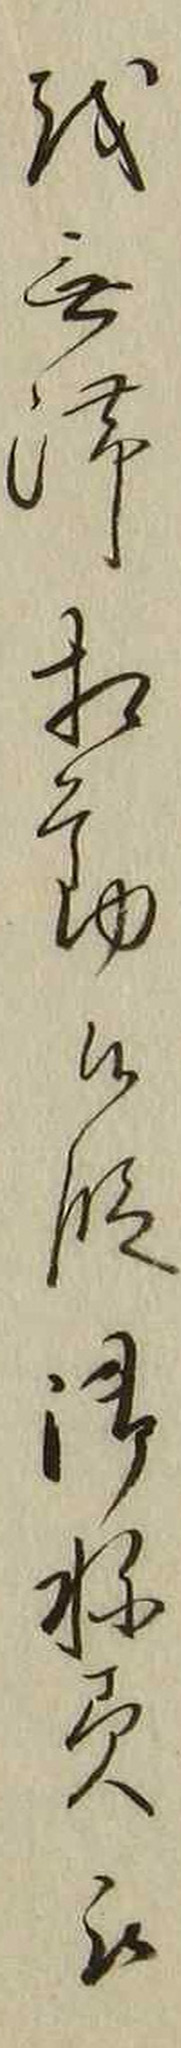越無滞相勤候段御褒美被
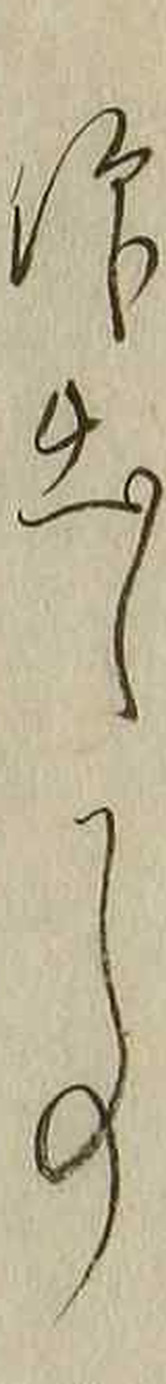仰出候事
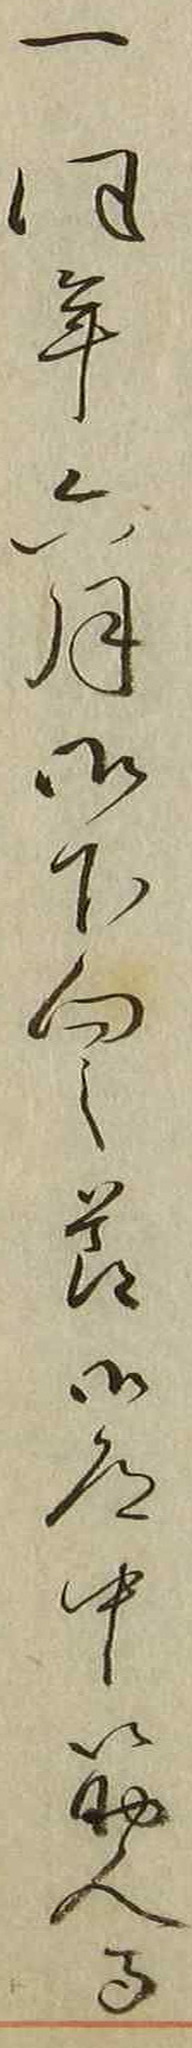一同年六月御下向之節御道中筋人馬
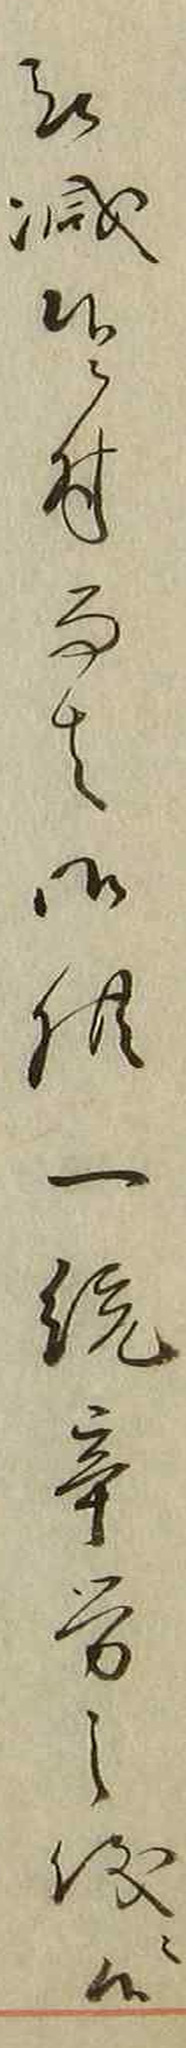被減に付而は御供一統辛労之儀に候
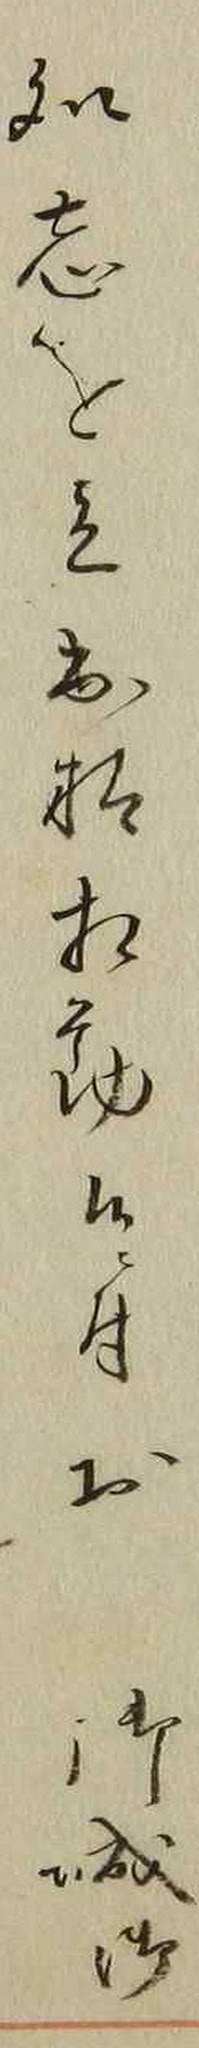処志を立出精相勤候に付於御城御
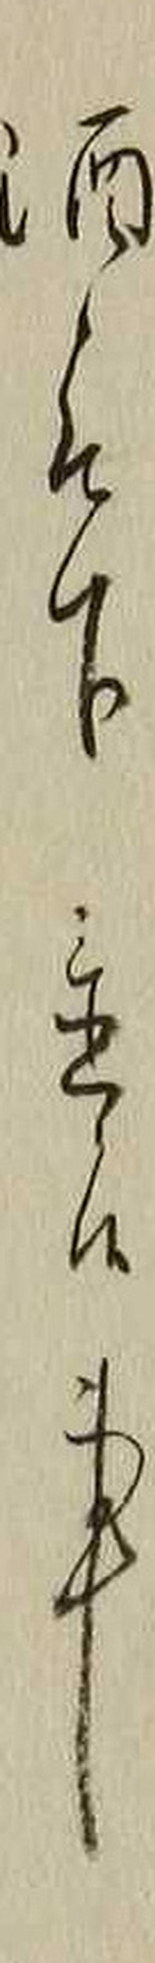酒被下置候事
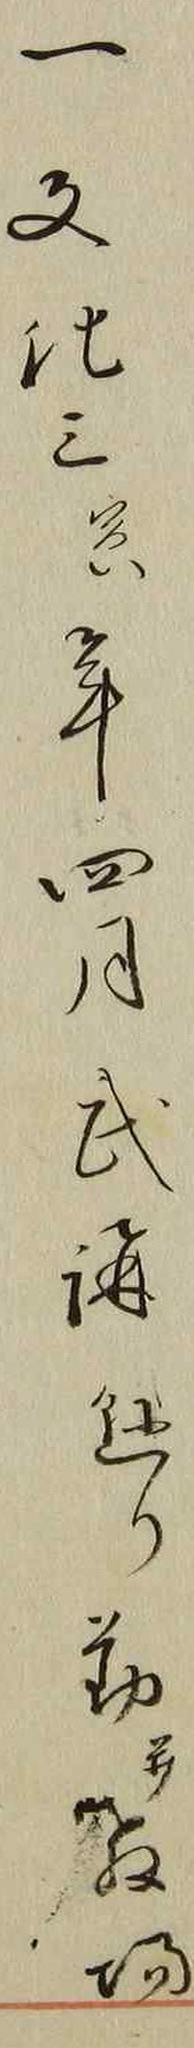一文化三寅年四月武講懸り勤并教場
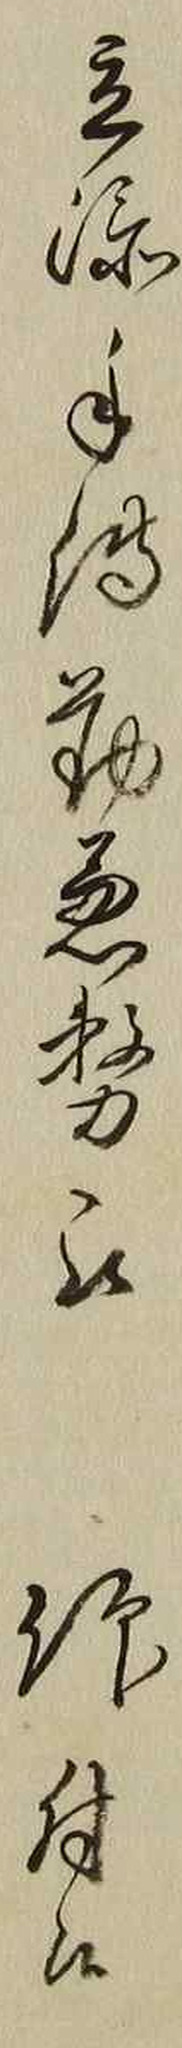立添手伝勤兼務被仰付候
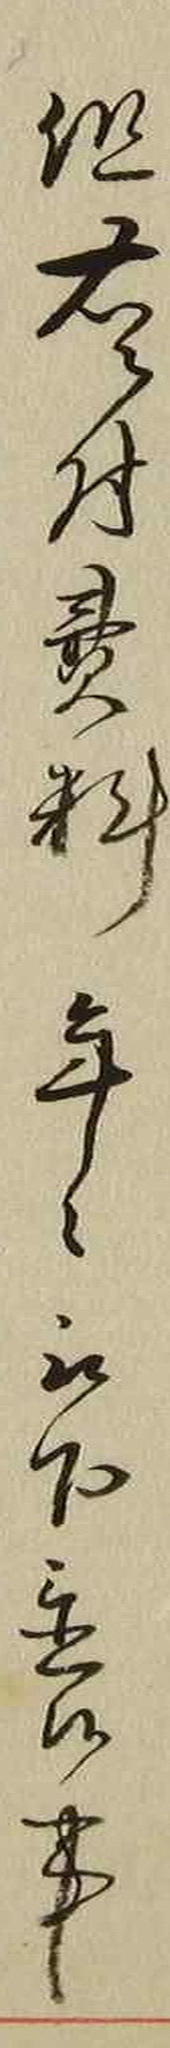但右に付費料年々被下置候事
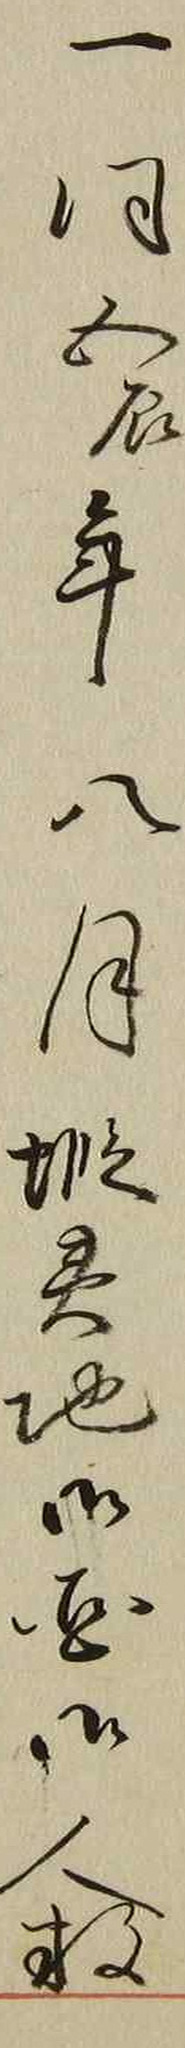一同五辰年八月蝦夷地御固御人数
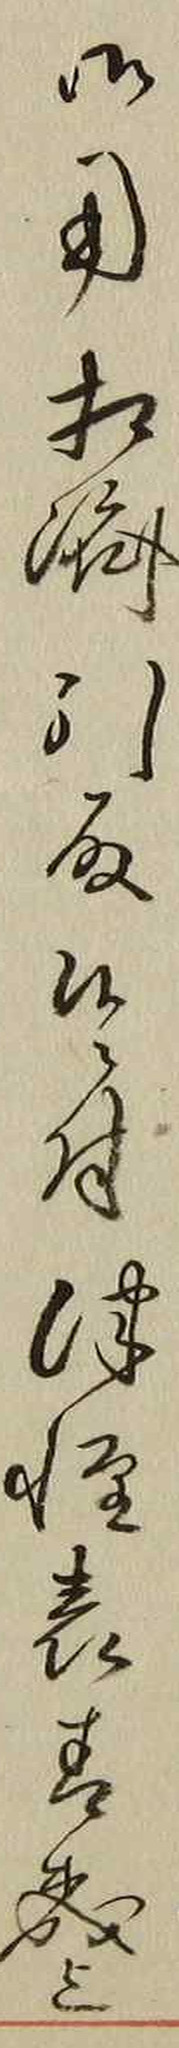御用相済引取候に付津軽表青森迄
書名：諸士系譜　巻之1　い之部1
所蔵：会津若松市立会津図書館
